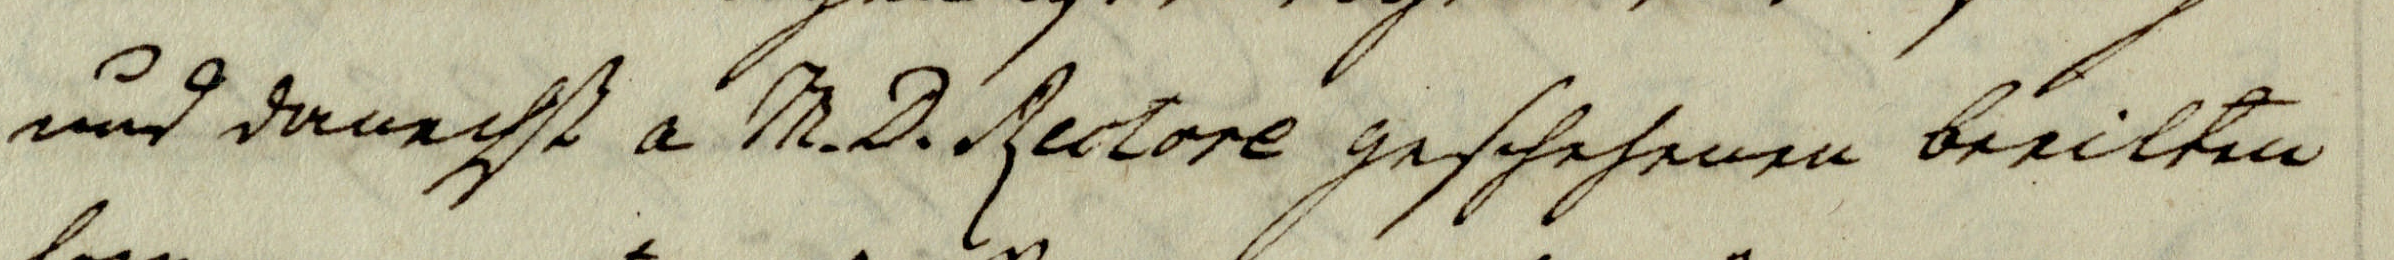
und danechst a M. D. Rectore geschehenen beeilten
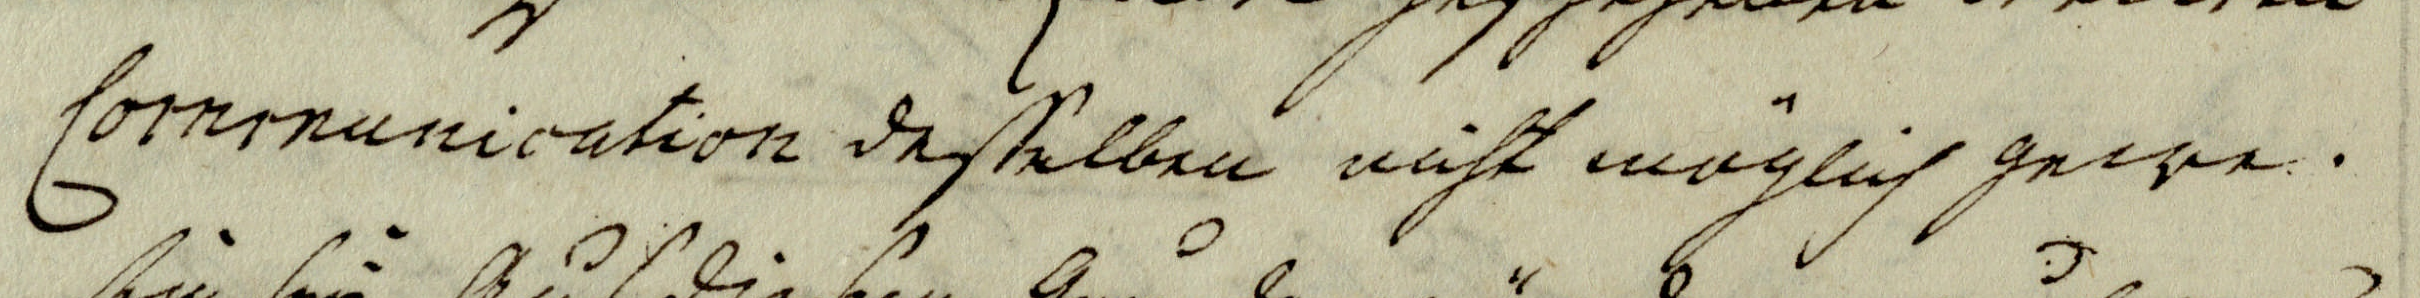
Communication desselben nicht möglich gewe¬
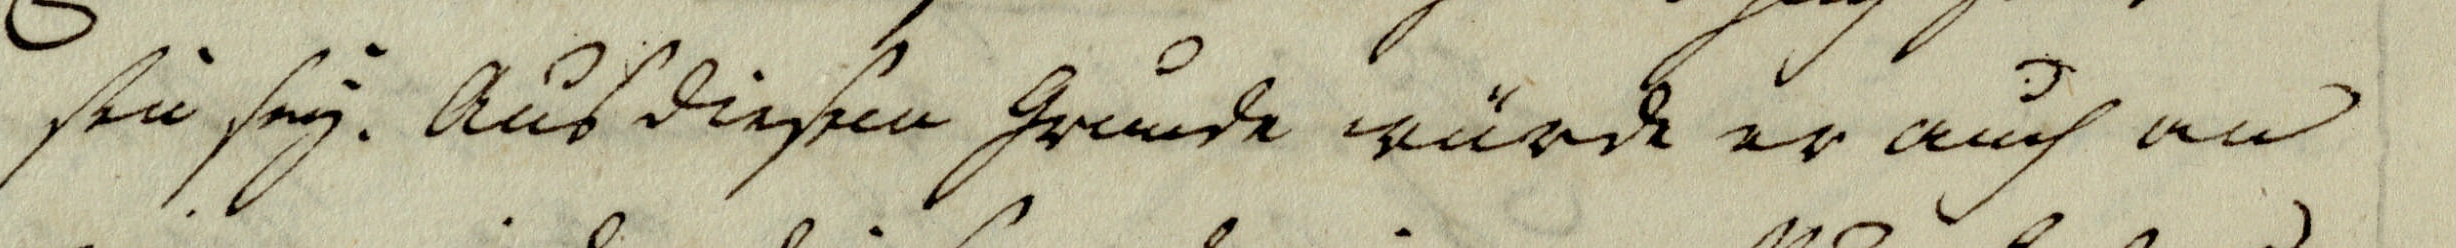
sen seÿ. Aus diesem Grunde würde er auch an
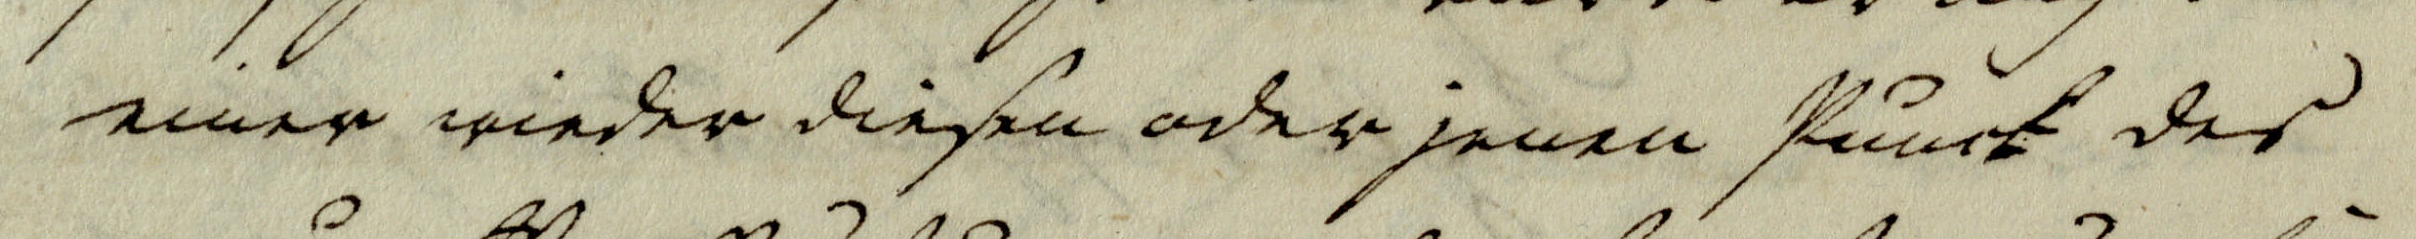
einer wieder diesen oder jenen Punct des
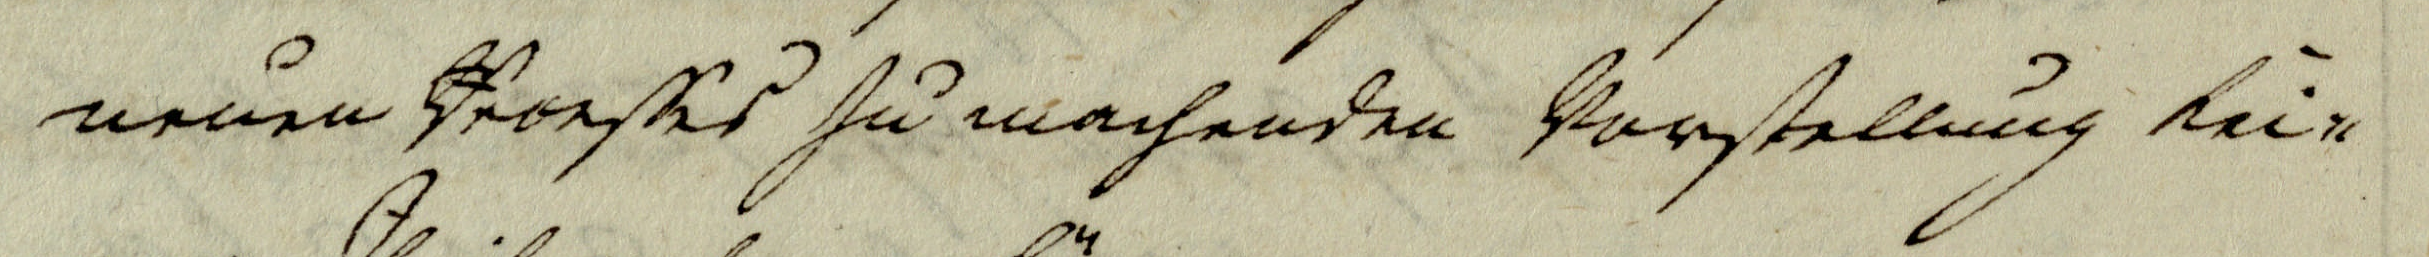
neuen Recesses zu machenden Vorstellung kei¬
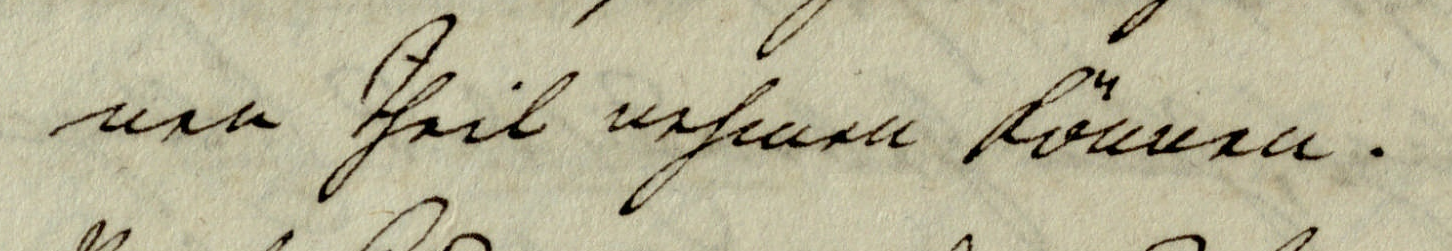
nen Theil nehmen können.
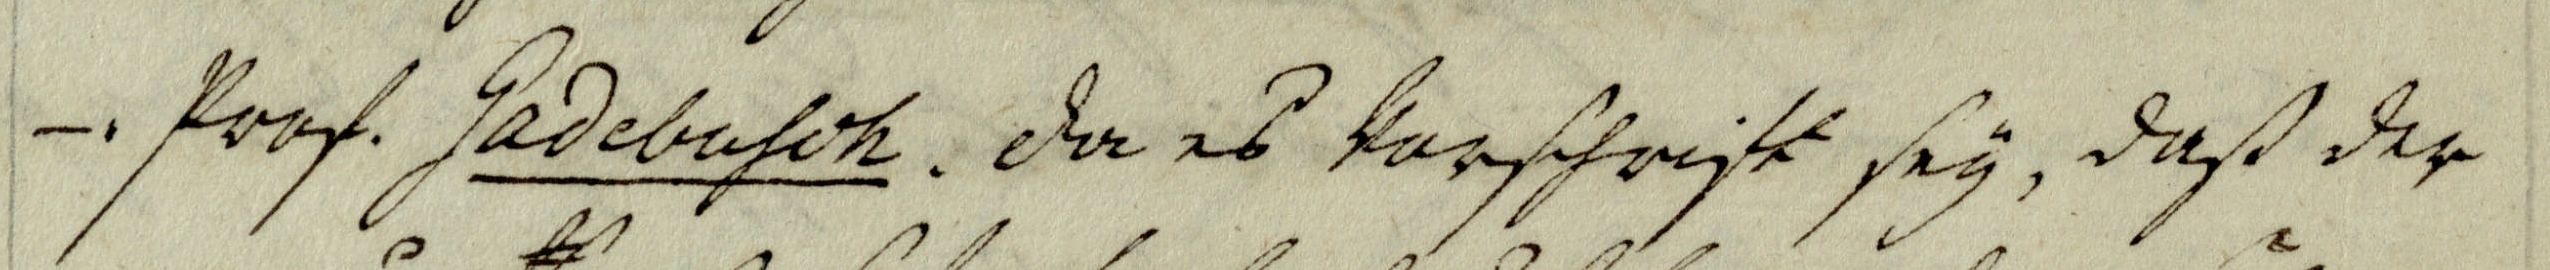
Prof. Gadebusch. Da es Vorschrift seÿ, daß der
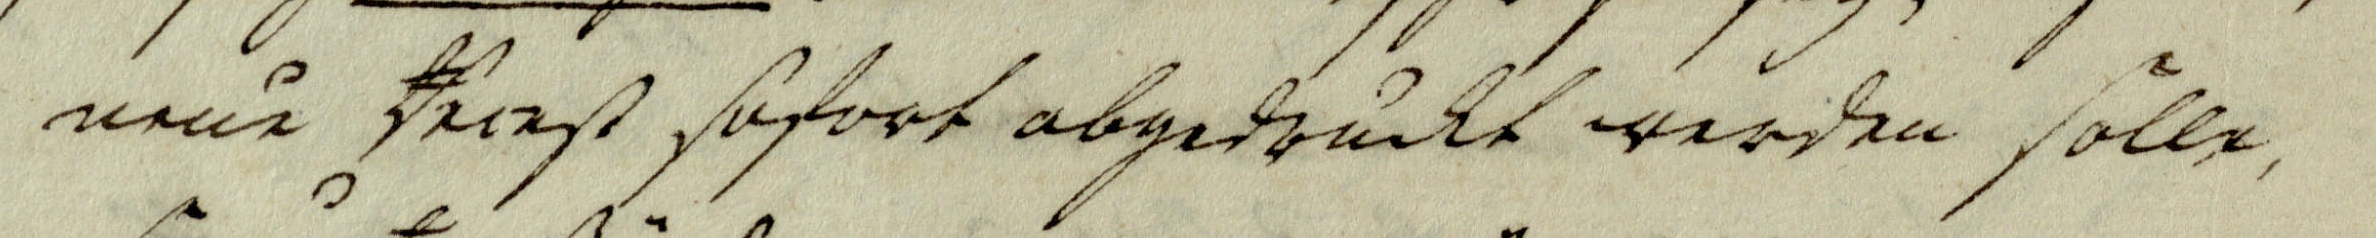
neue Receß sofort abgedruckt werden solle,
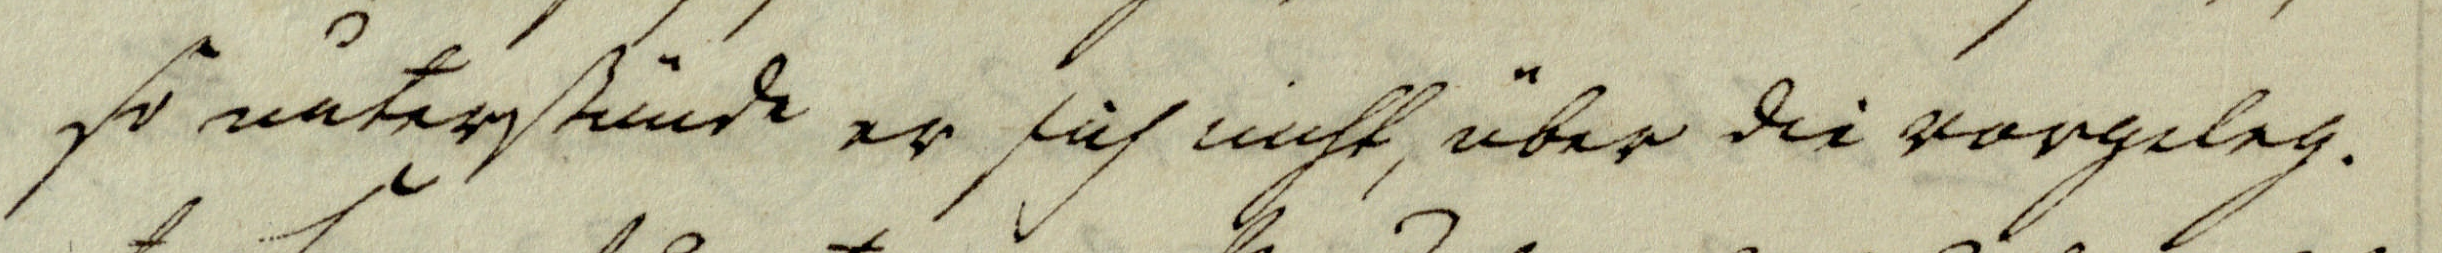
so unterstünde er sich nicht, über die vorgeleg¬
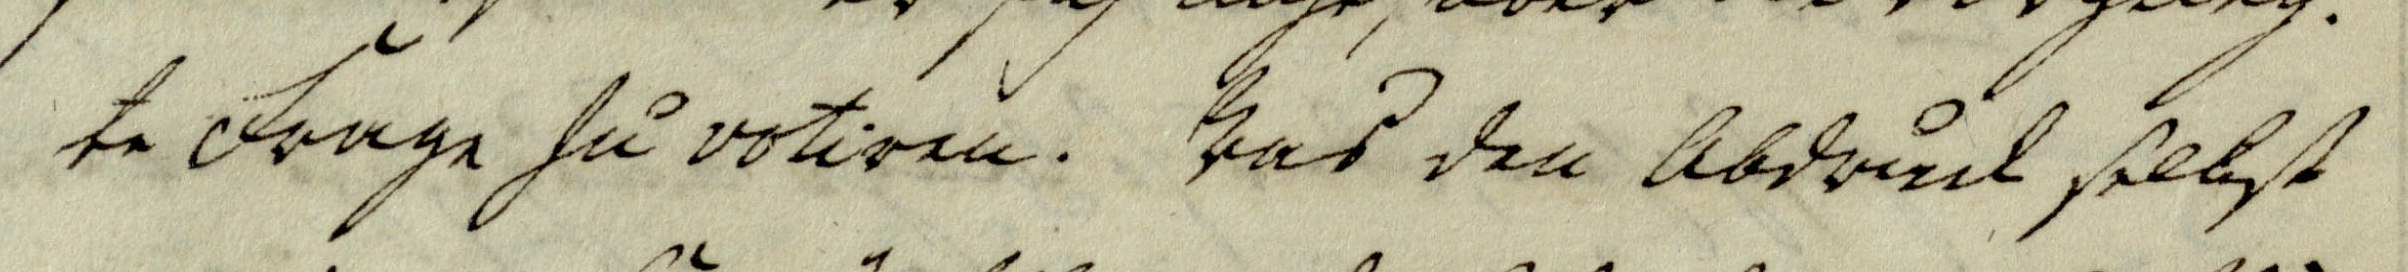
te Frage zu votiren. Was den Abdruck selbst
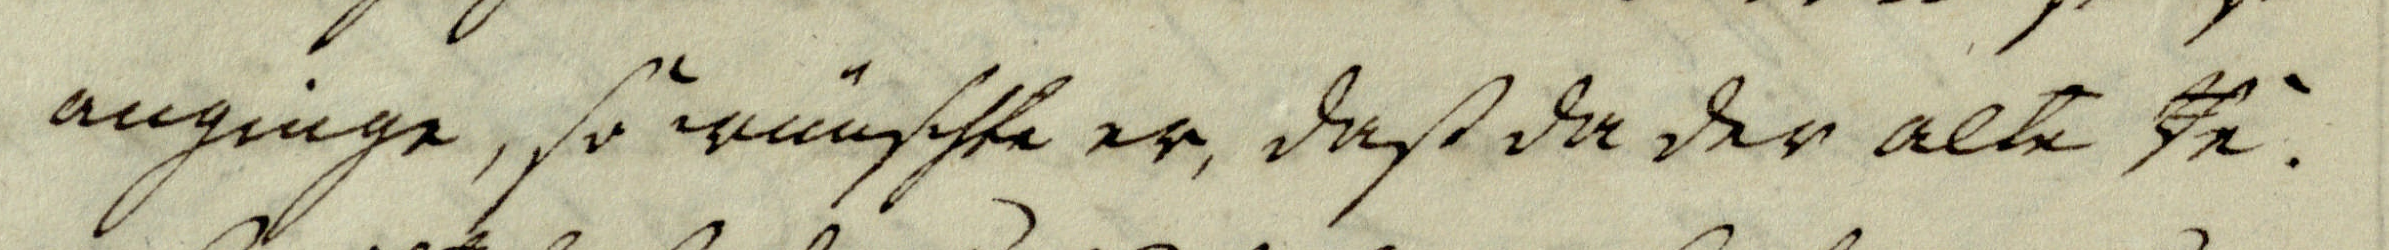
anginge, so wünschte er, daß da der alte Re¬
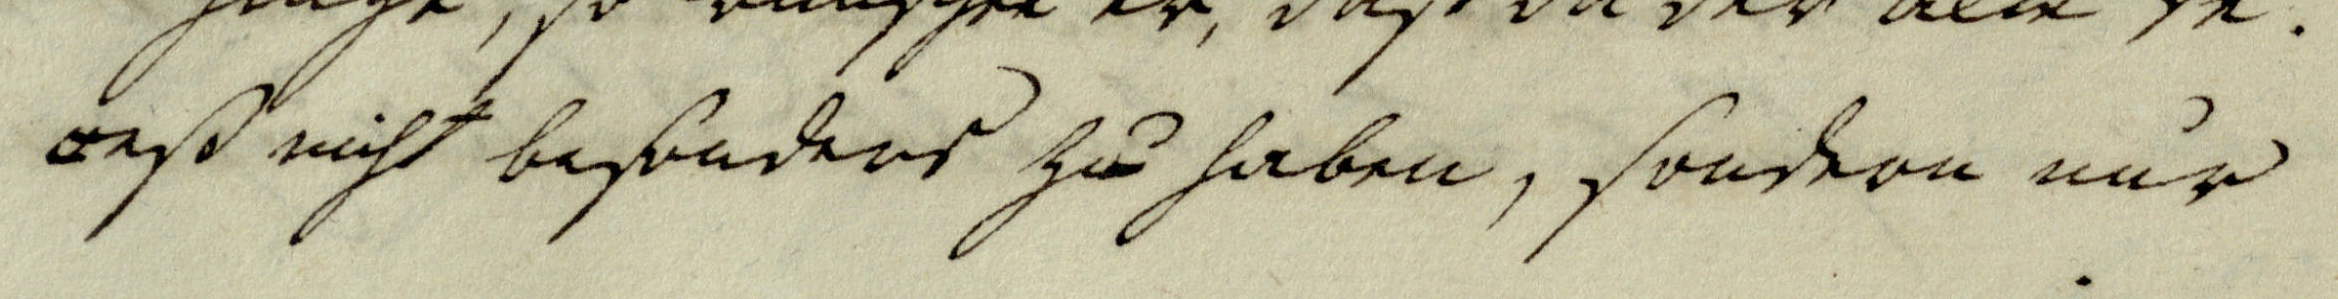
ceß nicht besonders zu haben, sondern nur
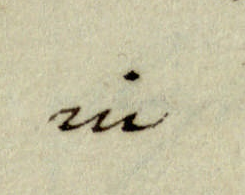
in
